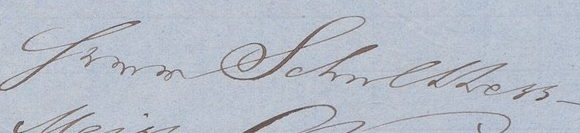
Herr Schulthess-
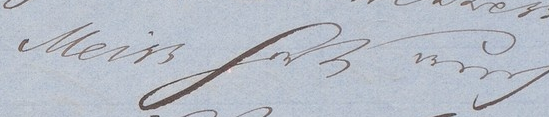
Meiss hat auch
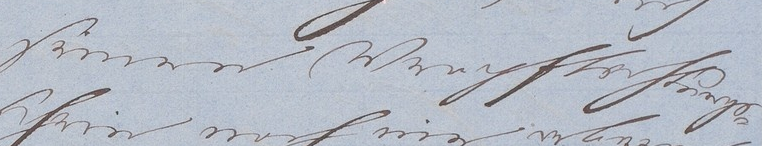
seinen Verpflichtungs-
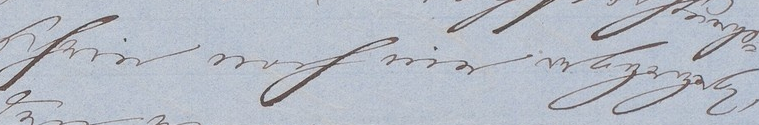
schein noch nie abgegeben,
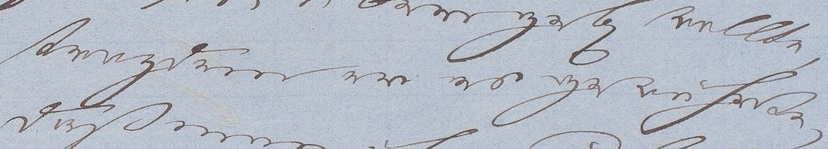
trozdem er es gewährte,
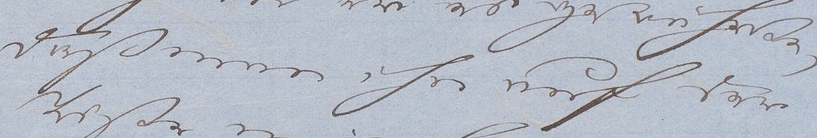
daß man ihn auf der
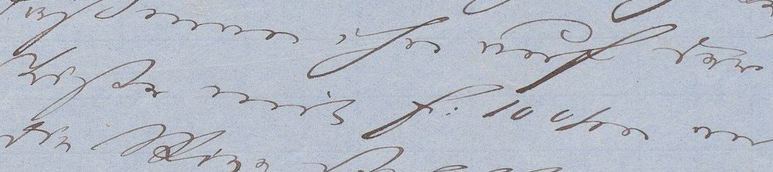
Liste mit f: 100/m an
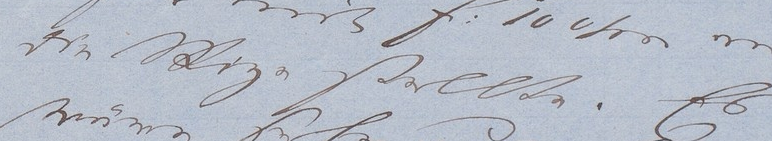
die Spize stellte. Es
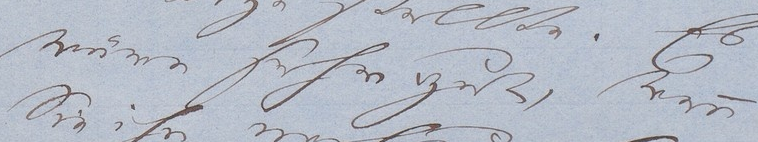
wäre sehr gut, wenn
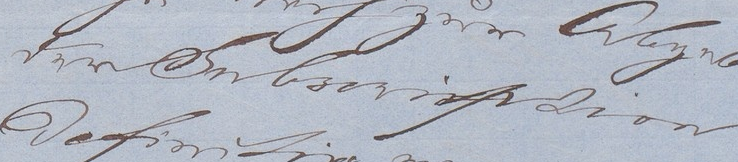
der Subscription
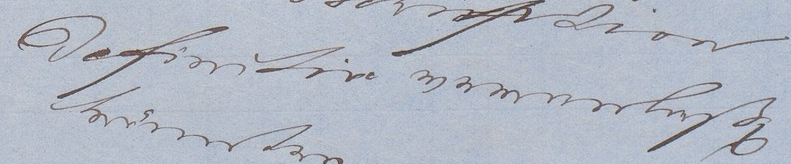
definitiv veranlaßen
